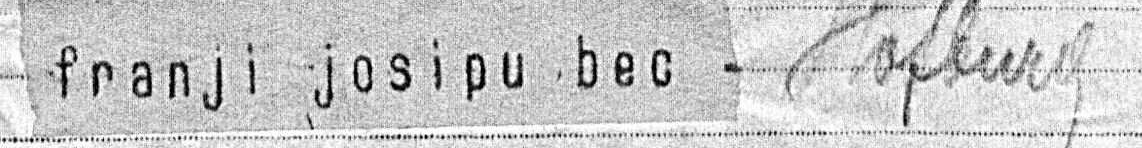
franji josipu bec Hofburg
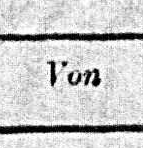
Von
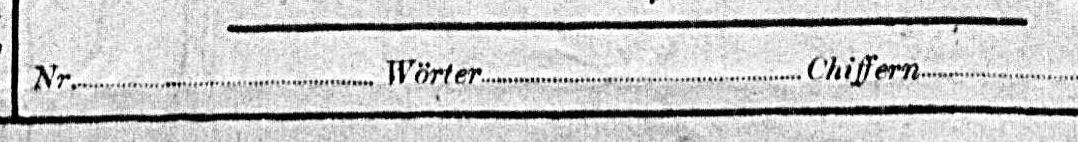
Nr.................................Wörter...............................Chiffern.................
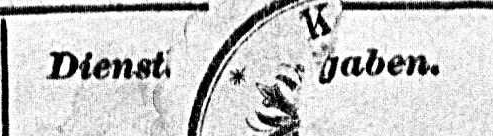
xx
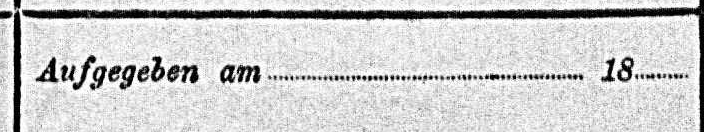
Aufgegeben am................................18....
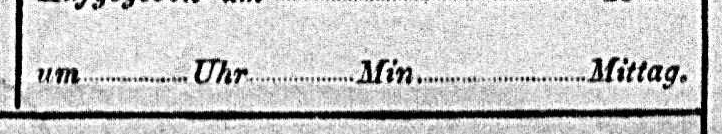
um ...............Uhr..........Min..............Mittag.
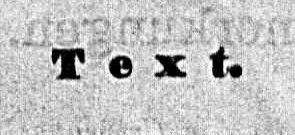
Text.
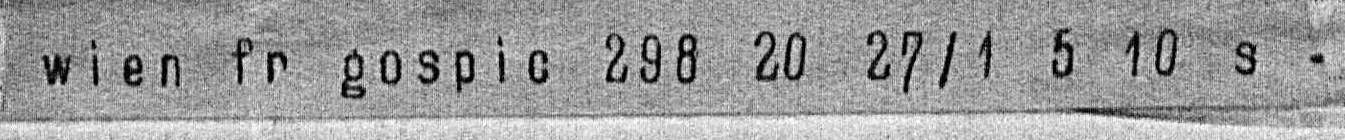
wien fr gospic 298 20 27/1 5 10 s.
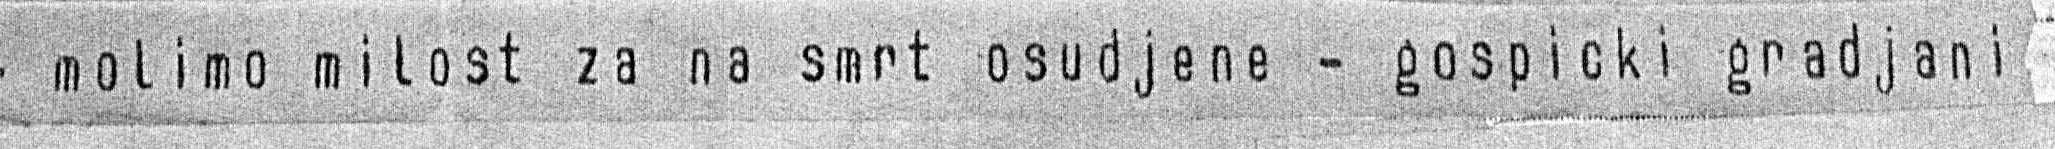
molimo milost za na smrt osudjene - gospicki gradjani
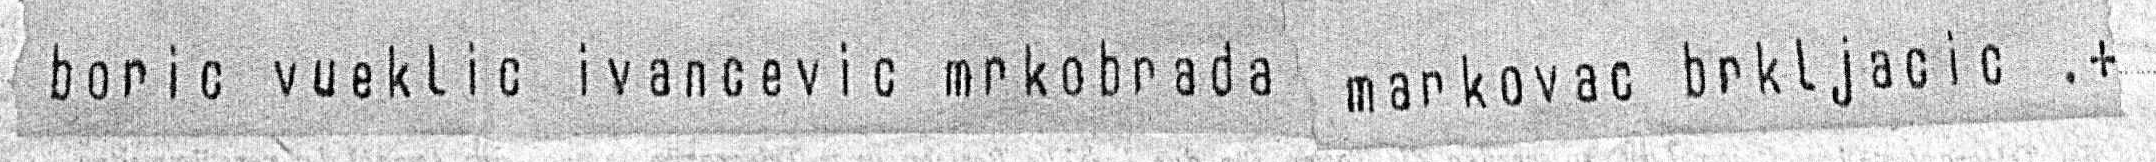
boric vueklic ivancevic mrkobrada markovac brkljcic .+
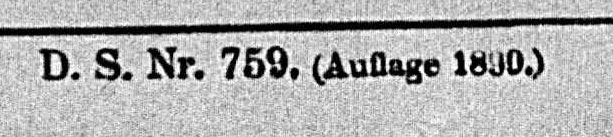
D. S. Nr. 759. (Auflage 1890.)
